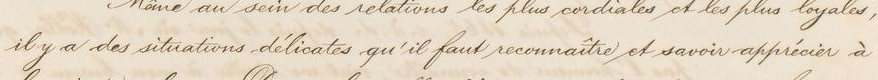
il y a des situations délicates qu'il faut reconnaître et savoir apprécier à
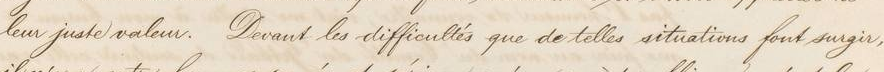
leur juste valeur. Devant les difficultés que de telles situations font surgir,
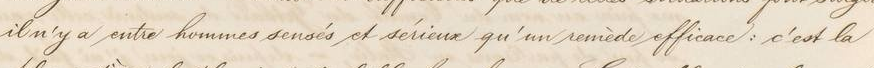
il n'y a entre hommes sensés et sérieux qu'un remède efficace: c'est la
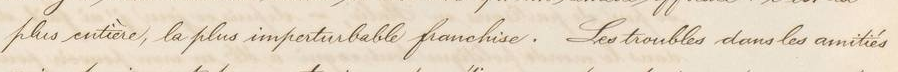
plus entière, la plus imperturbable franchise. Les troubles dans les amitiés
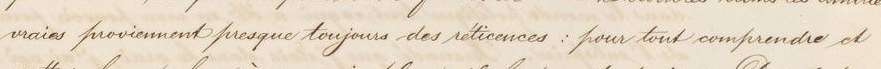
vraies proviennent presque toujours des réticences: pour tout comprendre et
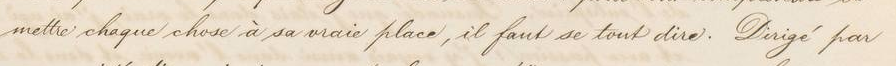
mettre chaque chose à sa vraie place, il faut se tout dire. Dirigé par
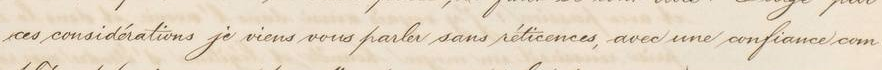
ces considérations je viens vous parler sans réticences, avec une confiance com-
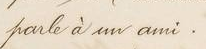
parle à un ami.
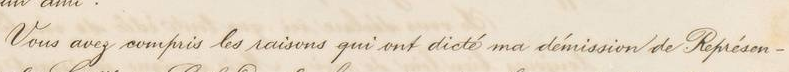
Vous avez compris les raisons qui ont dicté ma démission de Représen-
